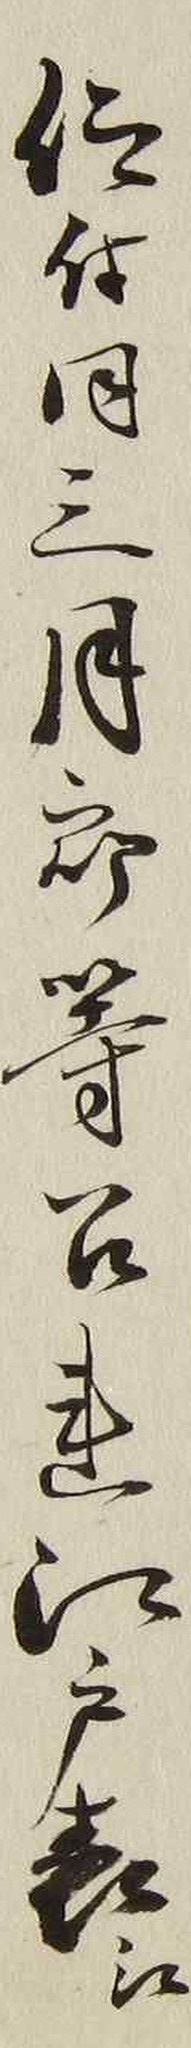仰付同三月郎等召連江戸表江
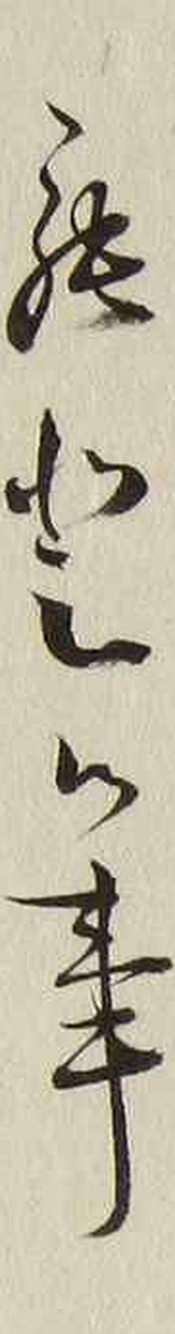罷登候事
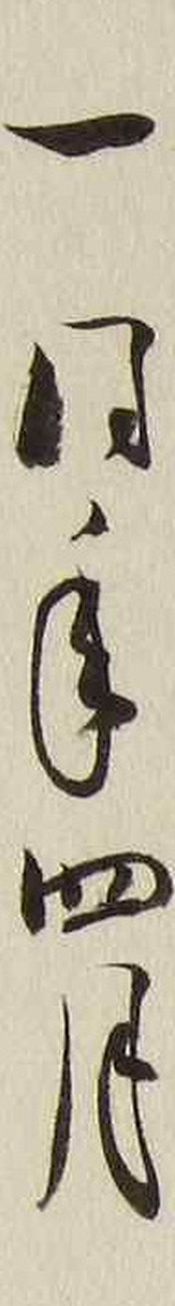一同年四月
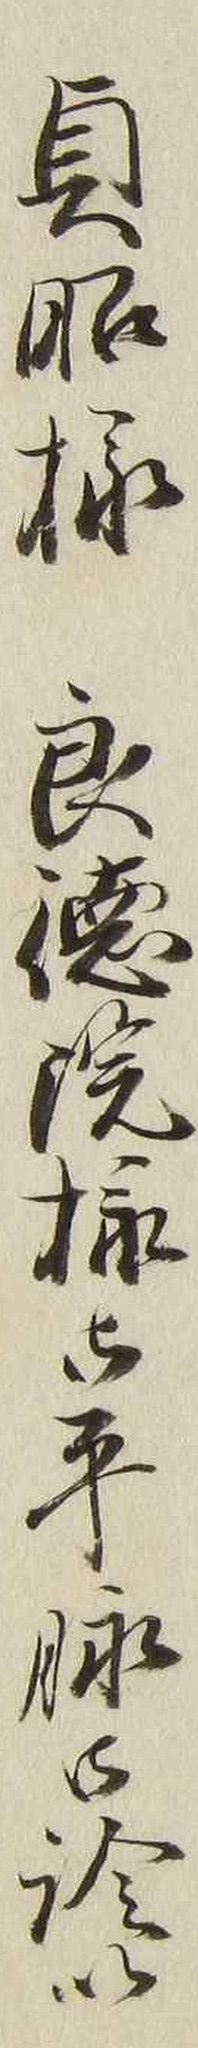貞昭様良徳院様御平脈御診以

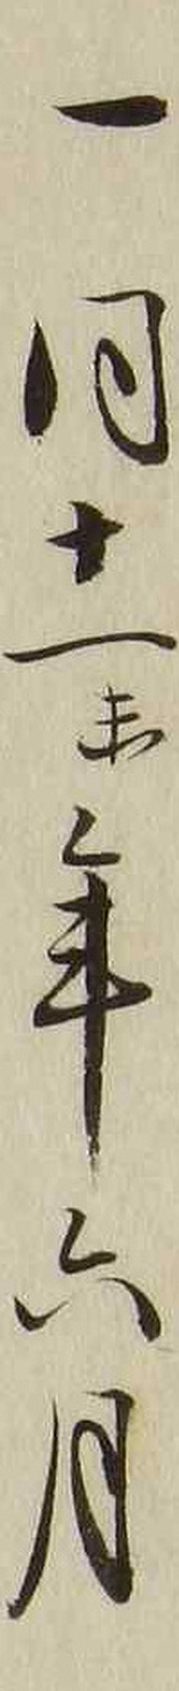一同十一未年六月
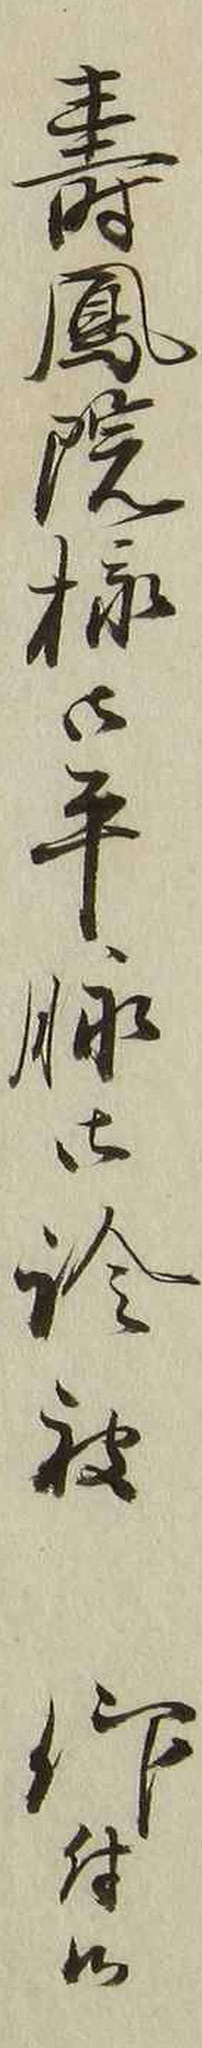寿鳳院様御平脈御診被仰付候
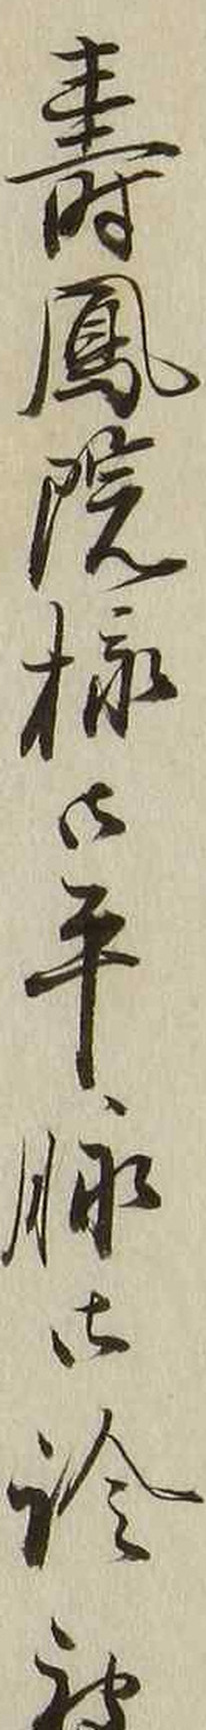松寿院様御平脈御診被
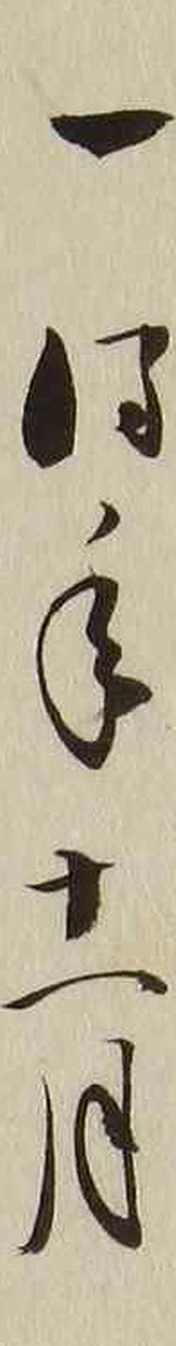一同年十一月
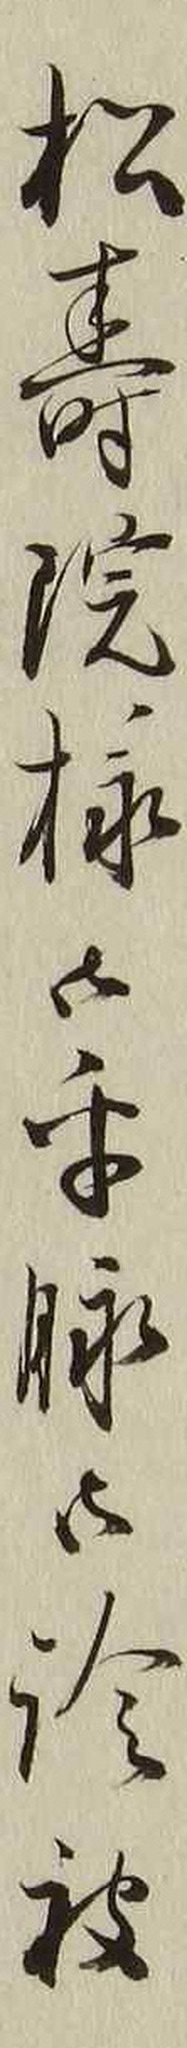松寿院様御平脈御診被
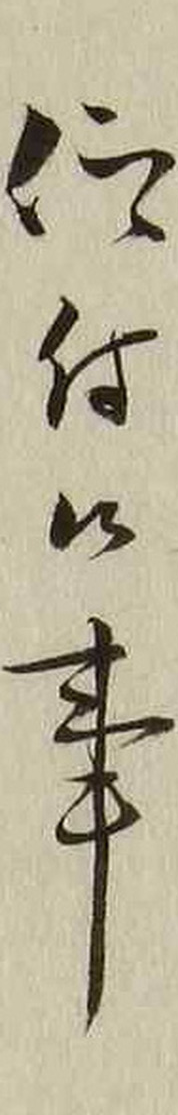仰付候事
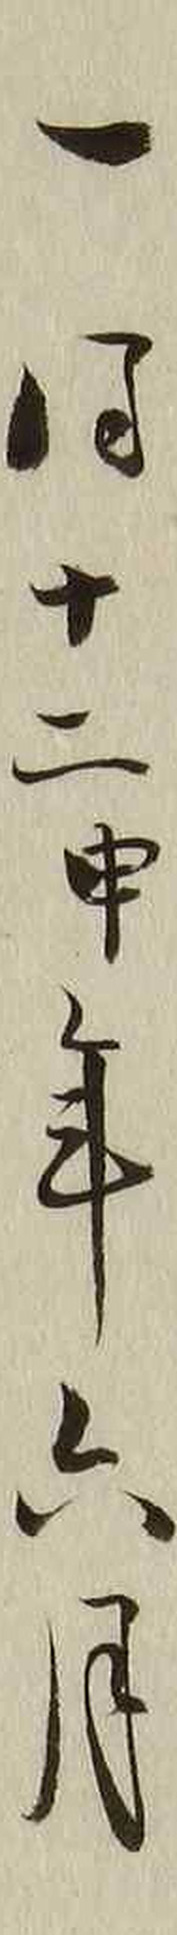一同十二申年六月
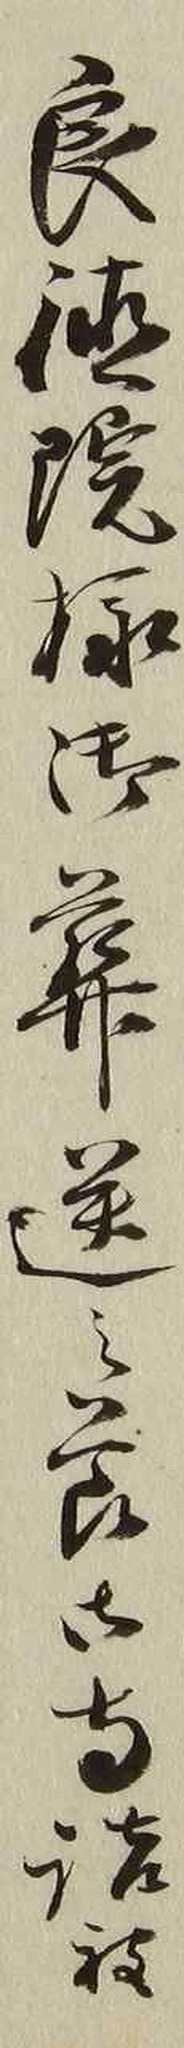良徳院様御葬送之節御寺詰被
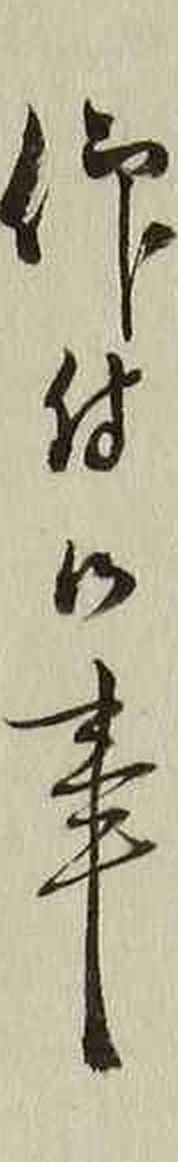仰付候事
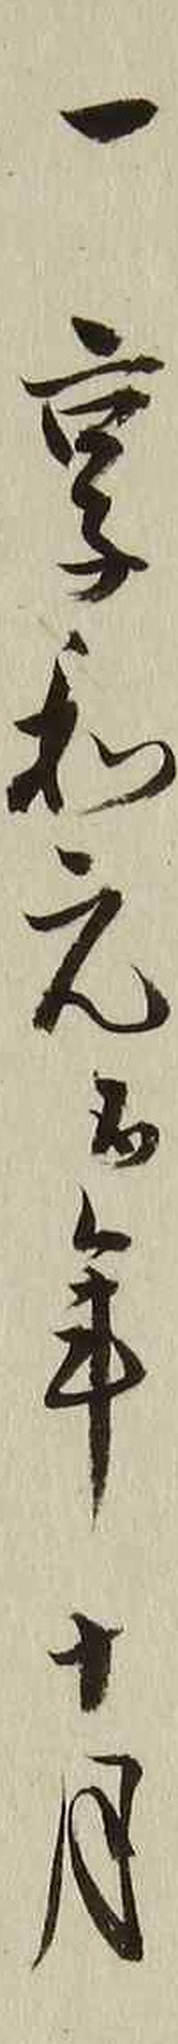一享和元酉年十月
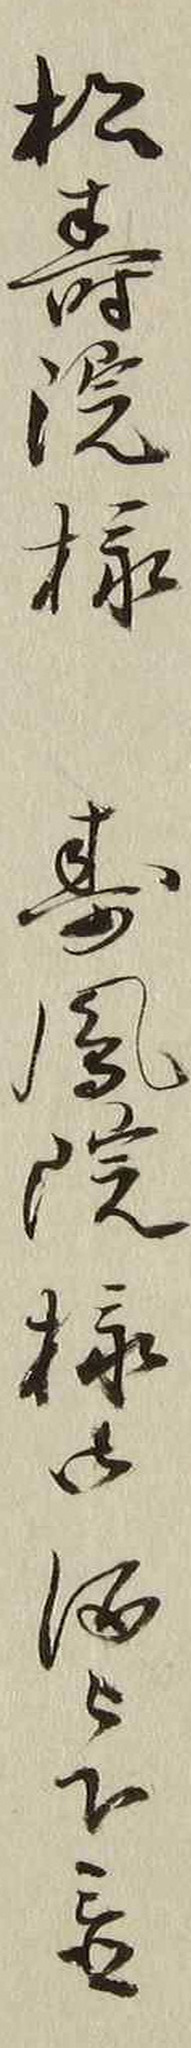松寿院様寿鳳院様御酒被下置
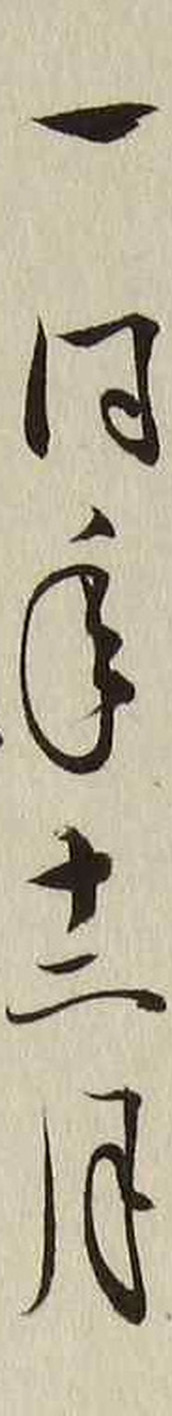一同年十二月
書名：諸士系譜　巻之157　ね之部1
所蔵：会津若松市立会津図書館
